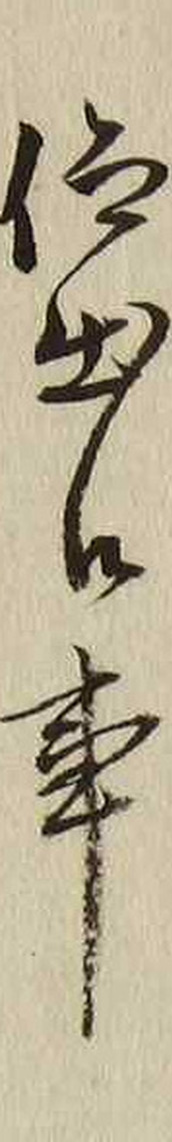仰出候事
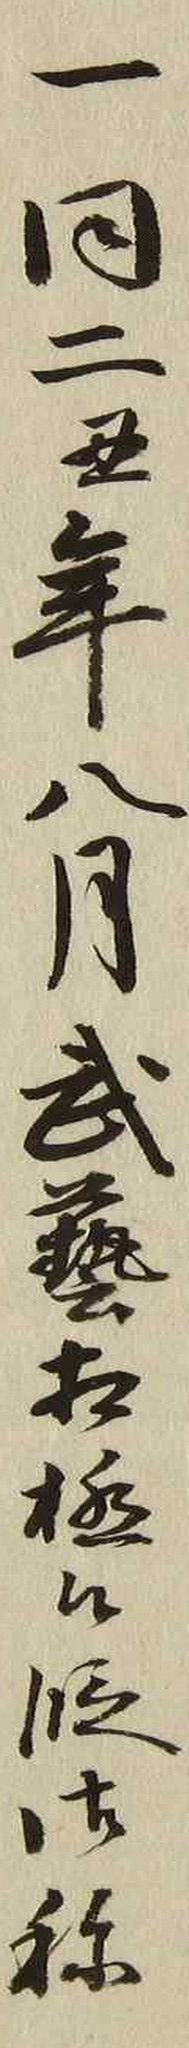一同二丑年八月弐芸相極候段御称
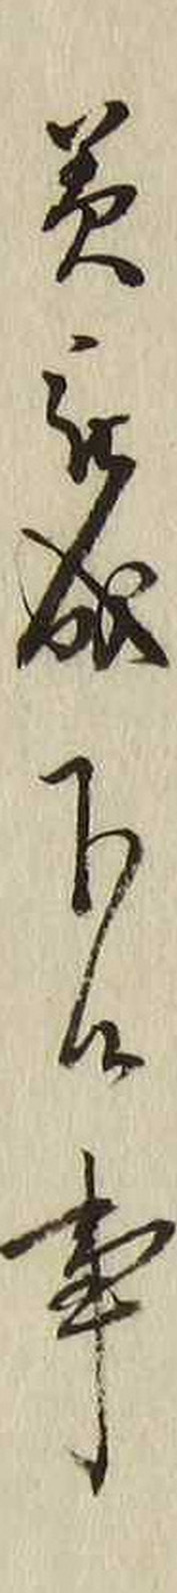美被成下候事
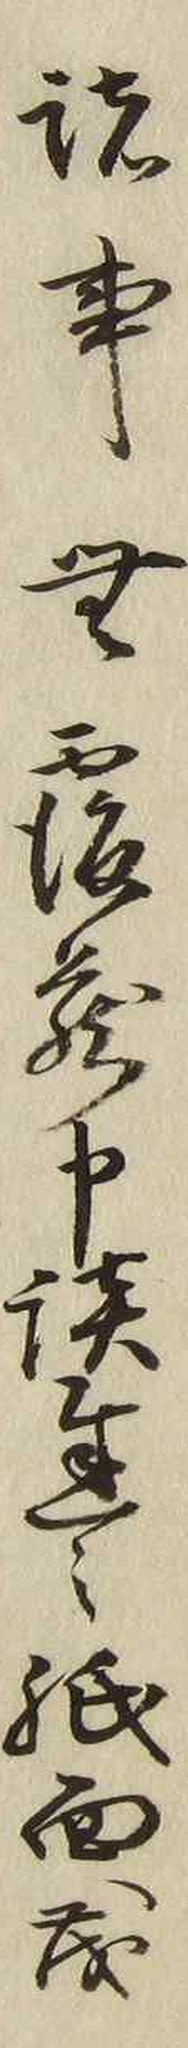諸事無覆蔵申談達之紙面へも
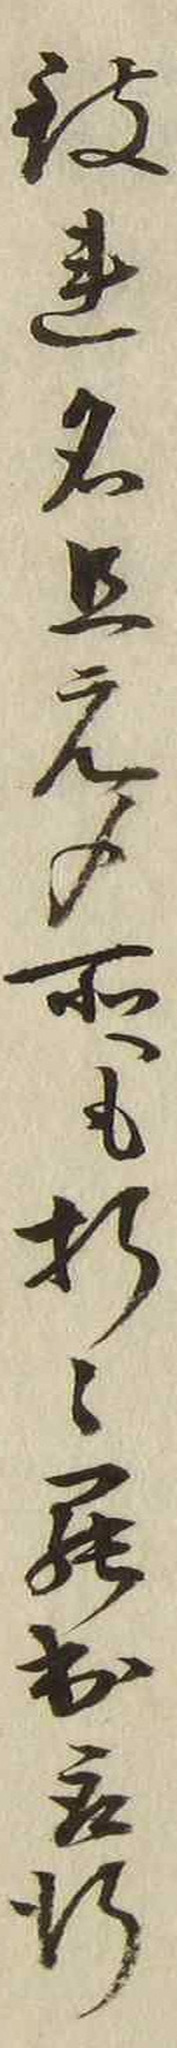致連名且元〆所へも折々罷出取行

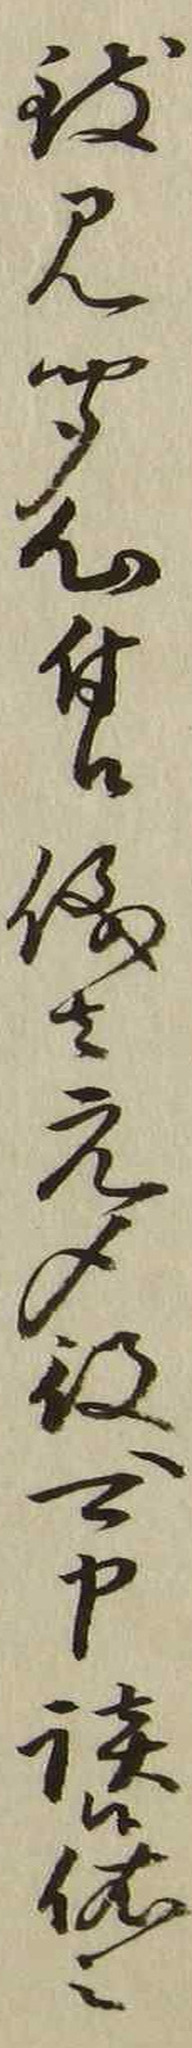致見聞心付候儀者元〆役へ可申談候依之
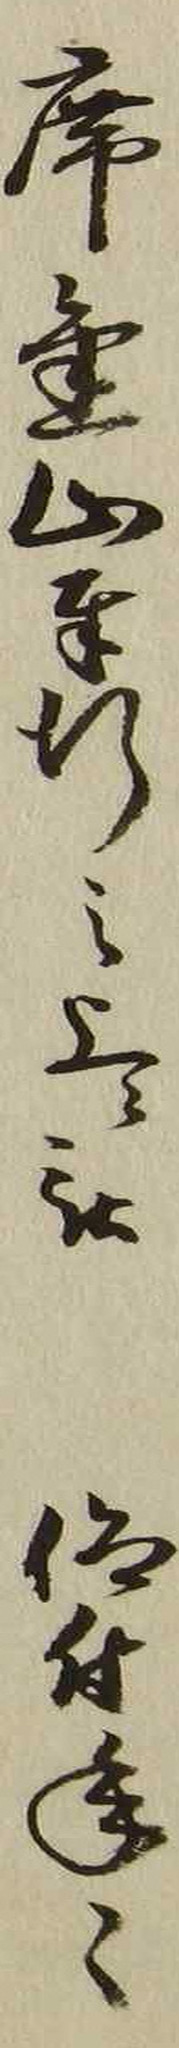席金山奉行之上ニ被仰付年々
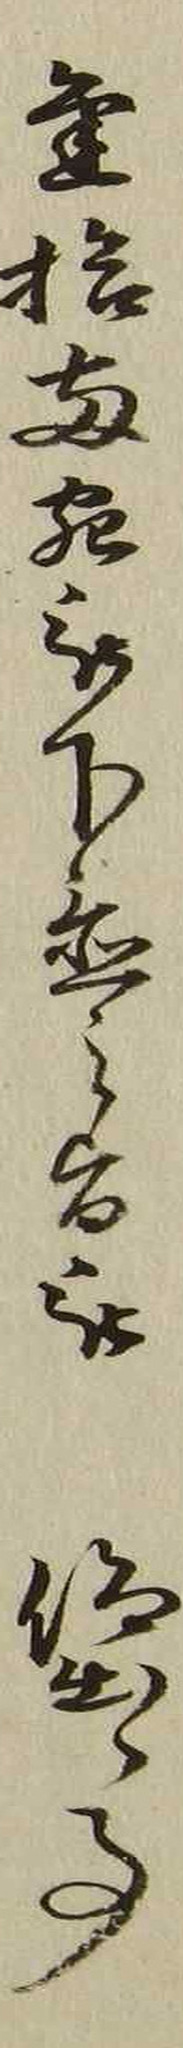金拾両宛被下置之旨被仰出候事
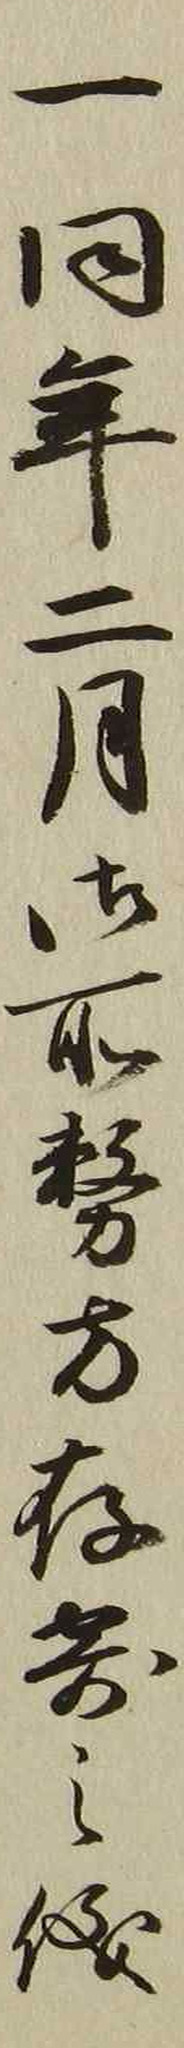一同年二月御所務方存寄之儀
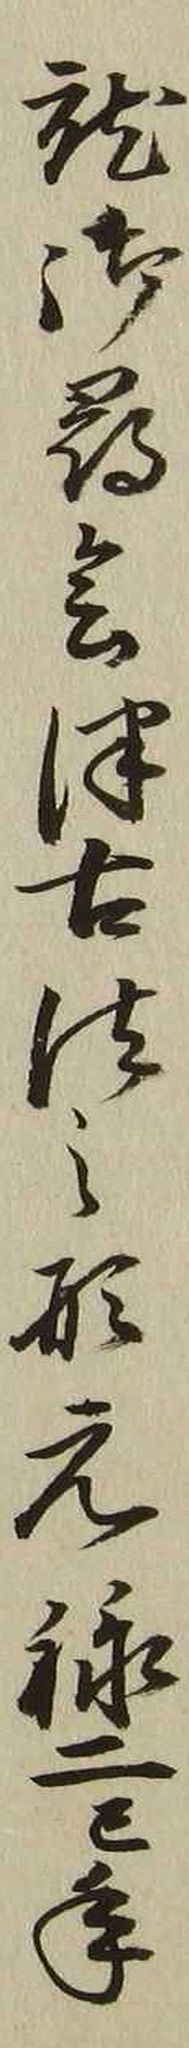就御尋会津古法之形元禄二巳年
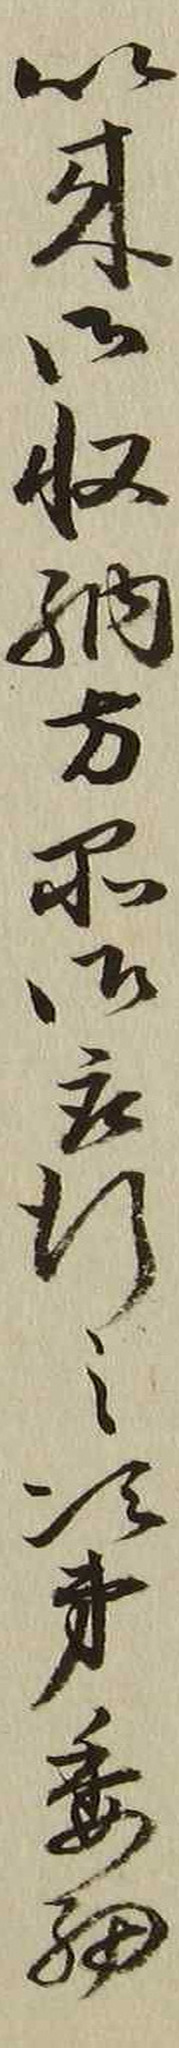以来御収納方品御取行之次第委細
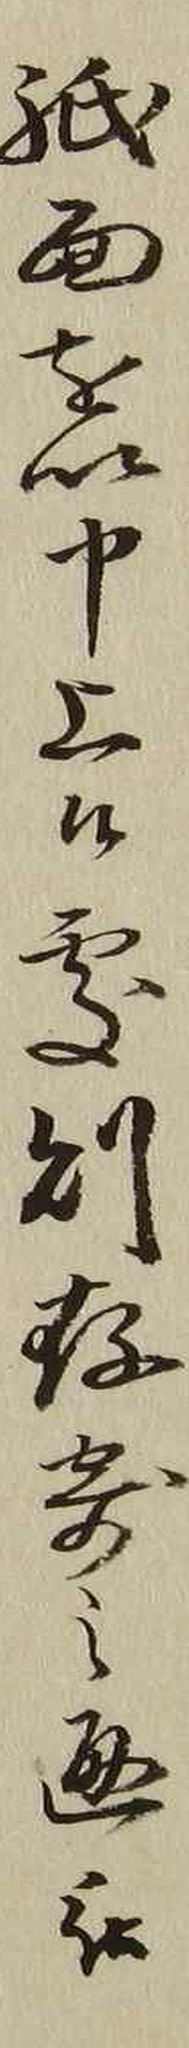紙面を以申上候処則存寄之通被
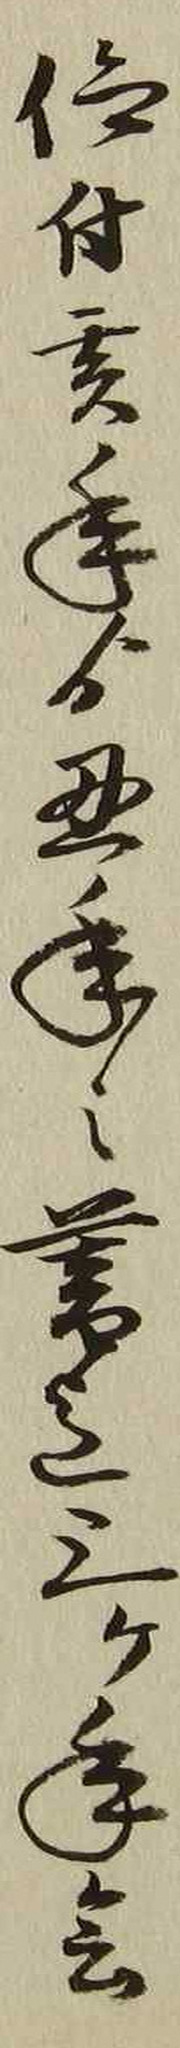仰付亥年ゟ丑年之暮迄三ヶ年会
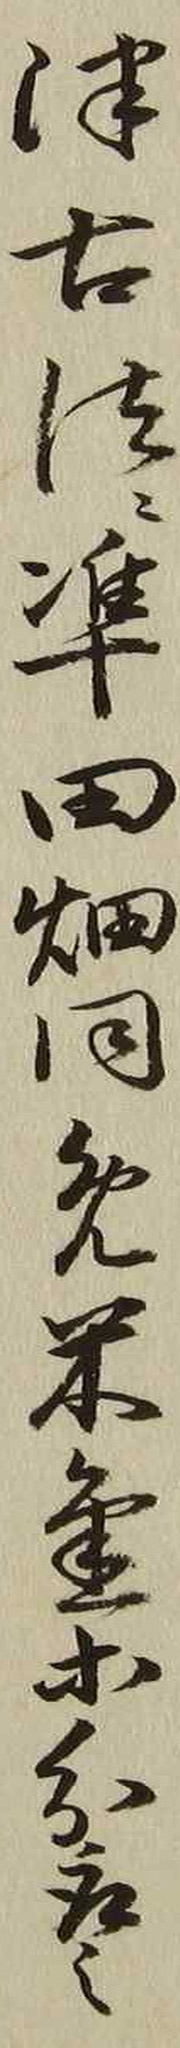津古法ニ準田畑同免米金等分取之
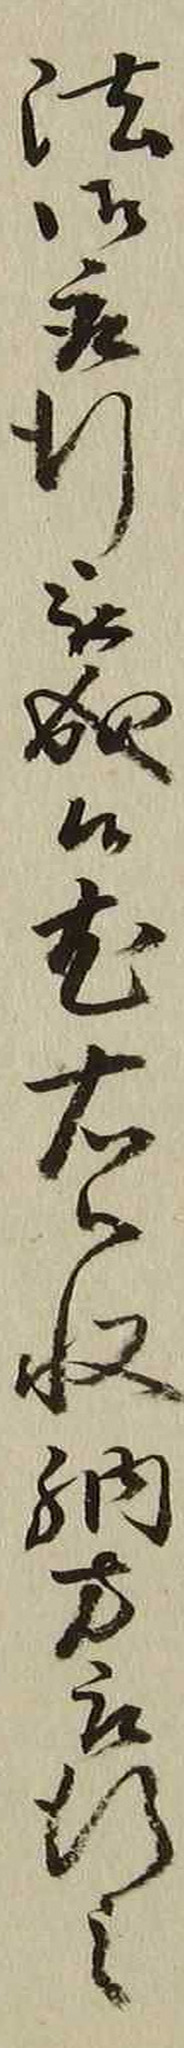法御取行被成候尤右御収納方取行之
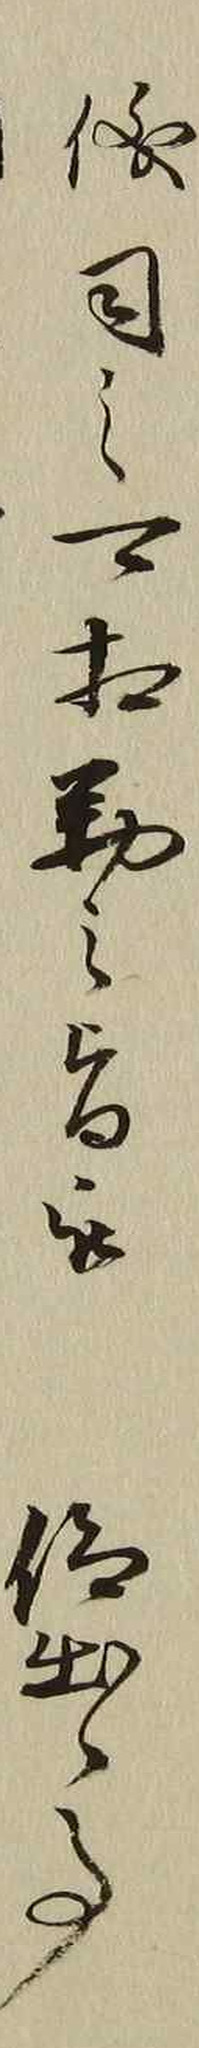儀司之可相勤之旨被仰出候事
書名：諸士系譜　巻之61　と之部4
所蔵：会津若松市立会津図書館
